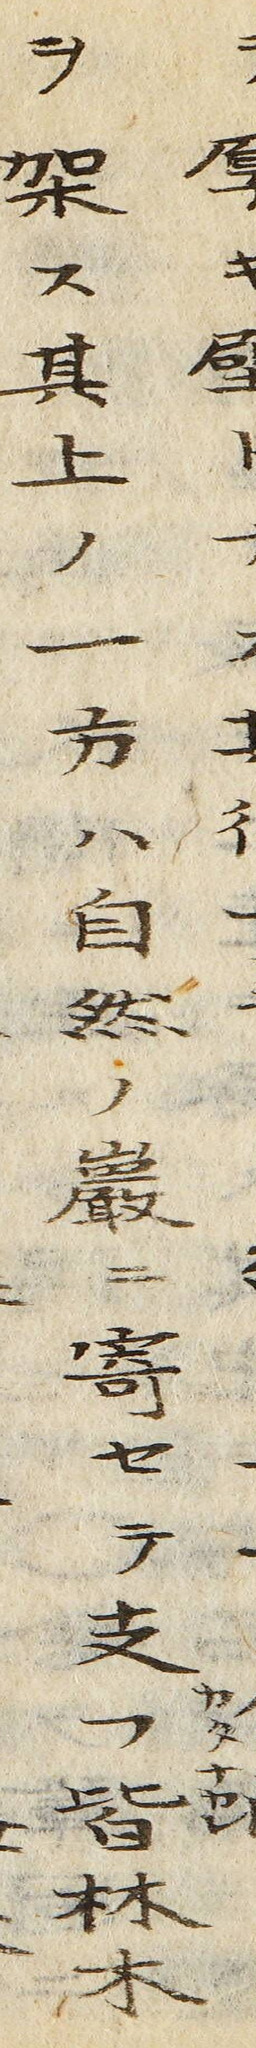ヲ架ス其上ノ一方ハ自然ノ巌ニ寄セテ支フ皆林木
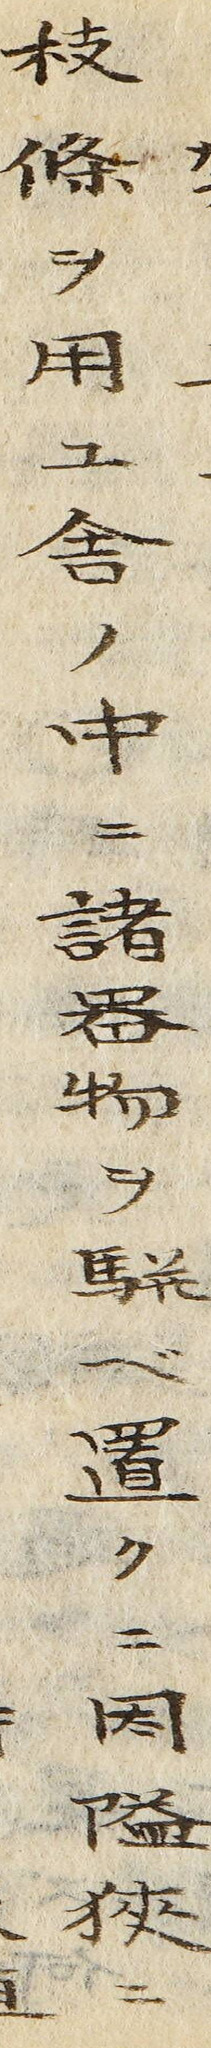枝條ヲ用ユ舎ノ中ニ諸器物ヲ駢ベ置クニ因隘狭ニ
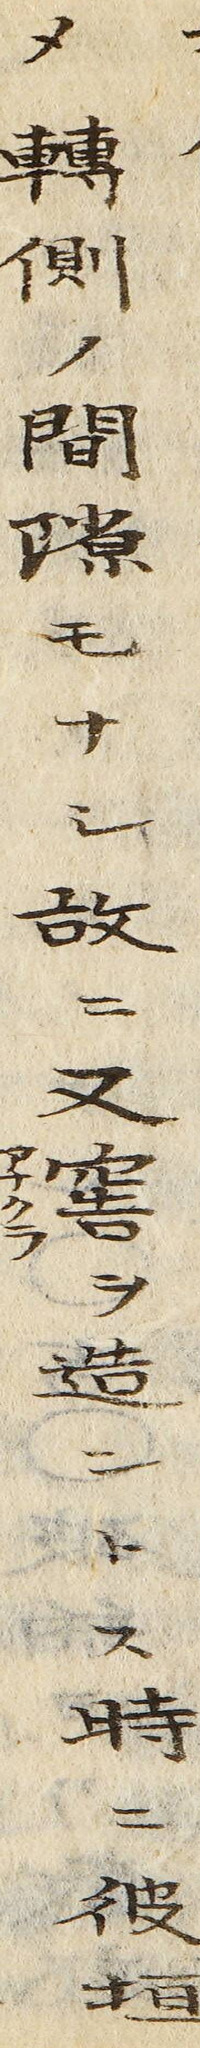シテ轉側ノ間隙モナシ故ニ又窖ヲ造ントス時ニ彼垣
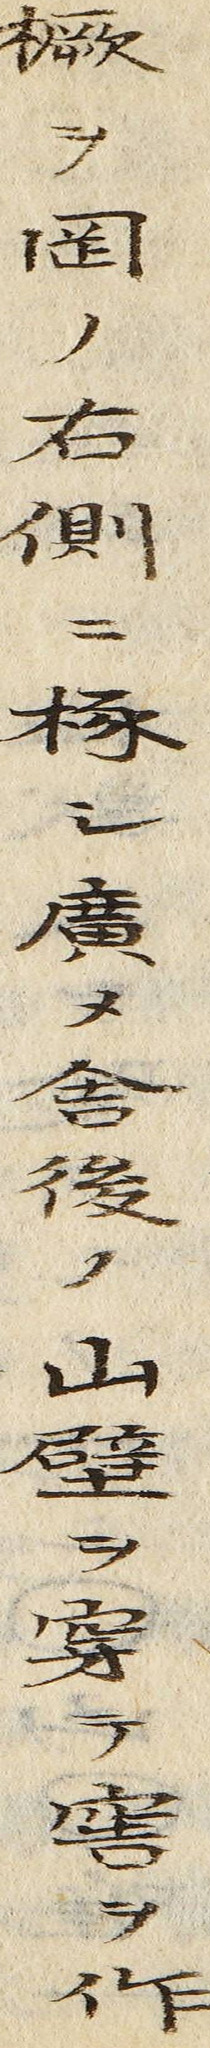橛ヲ岡ノ右側ニ椽シ広メ舎後ノ山壁ヲ穿テ窖ヲ作
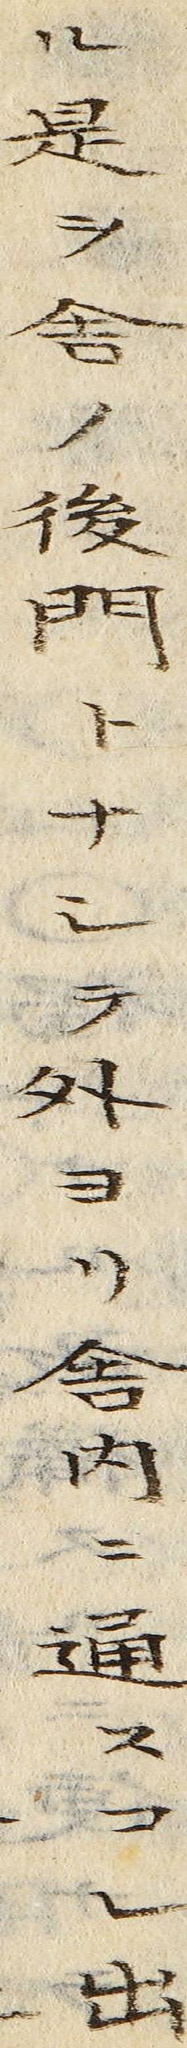ル是ヲ舎ノ後門トナシテ外ヨリ舎内ニ通スコレ出
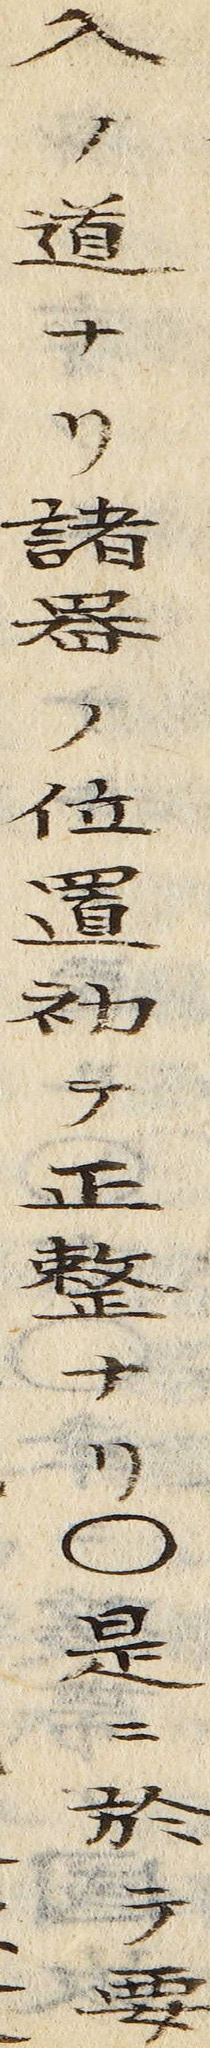入ノ道ナリ諸器ノ位置初テ正整ナリ◯是ニ於テ要
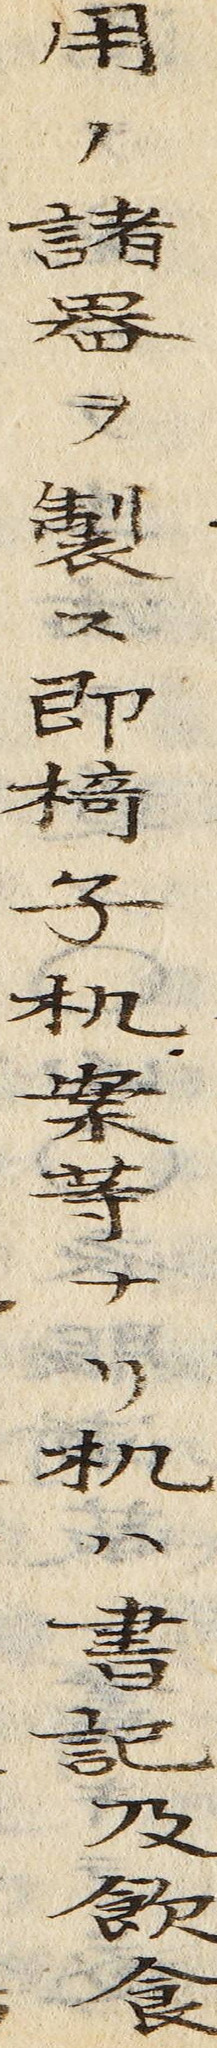用ノ諸器ヲ製ス即椅子机案等ナリ机ハ書記及飲食
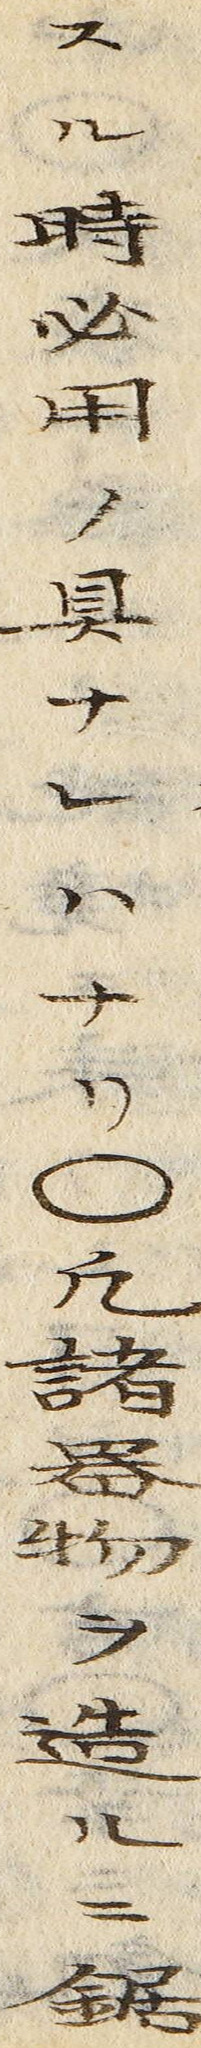スル時必用ノ具ナレハナリ◯凡諸器物ヲ造ルニ鋸
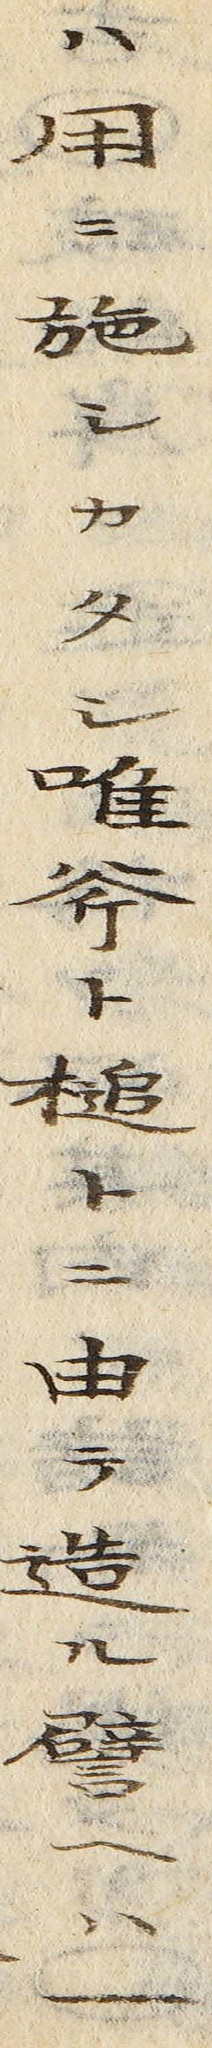ハ用ニ施シカタシ唯斧ト槌トニ由テ造ル譬ヘハ一
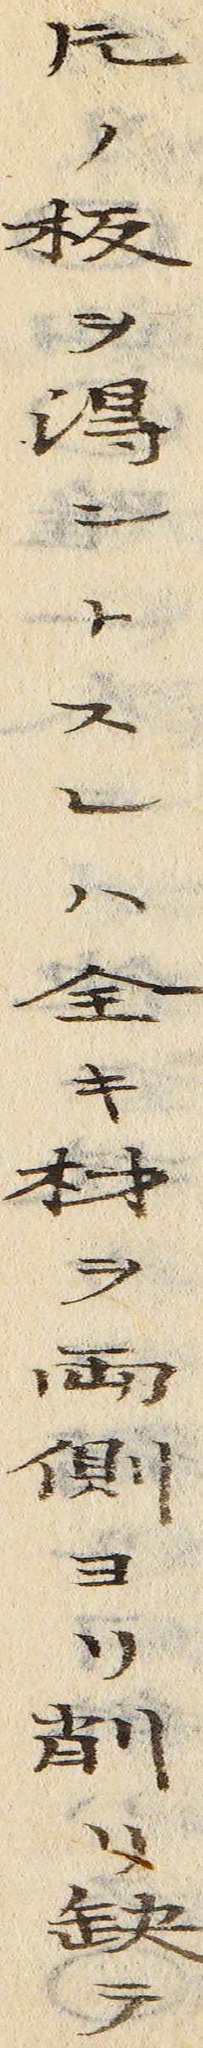片ノ板ヲ得ントスレハ全キ材ヲ両側ヨリ削リ欠テ
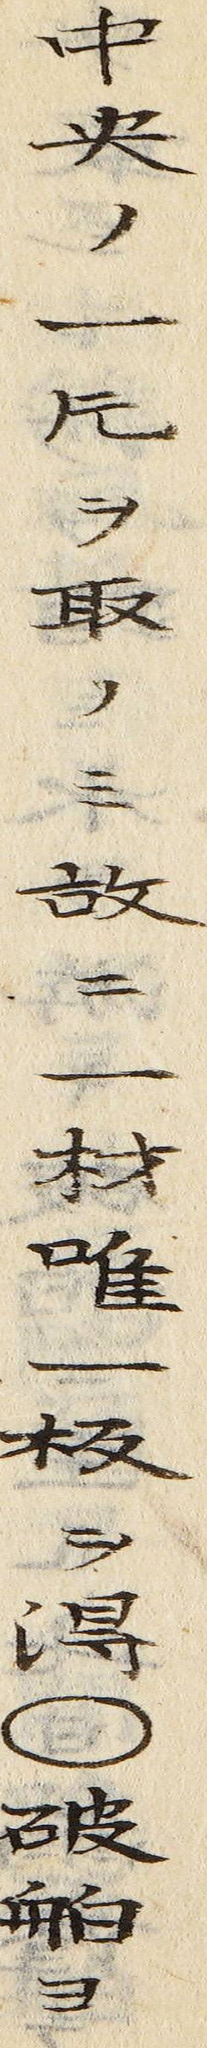中央ノ一片ヲ取ノミ故ニ一材唯一板ヲ得◯破舶ヨ
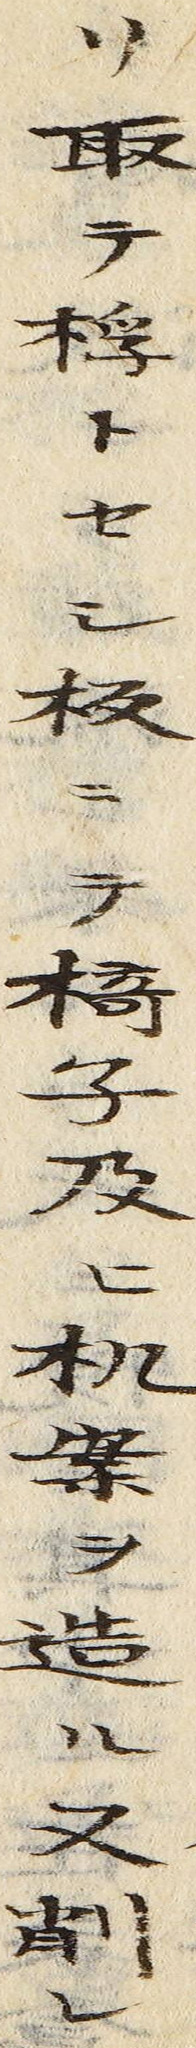リ取テ桴トセシ板ニテ椅子及ヒ机案ヲ造ル又削レ
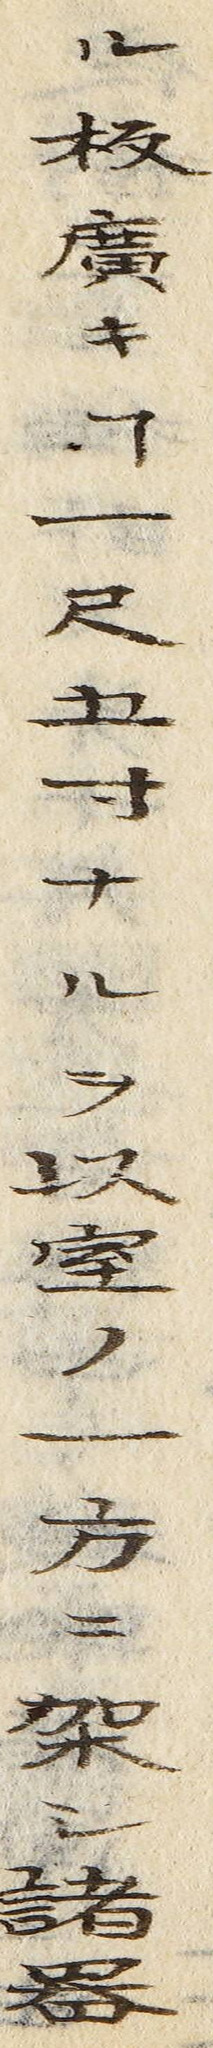ル板広キコト一尺五寸ナルヲ以室ノ一方ニ架シ諸器
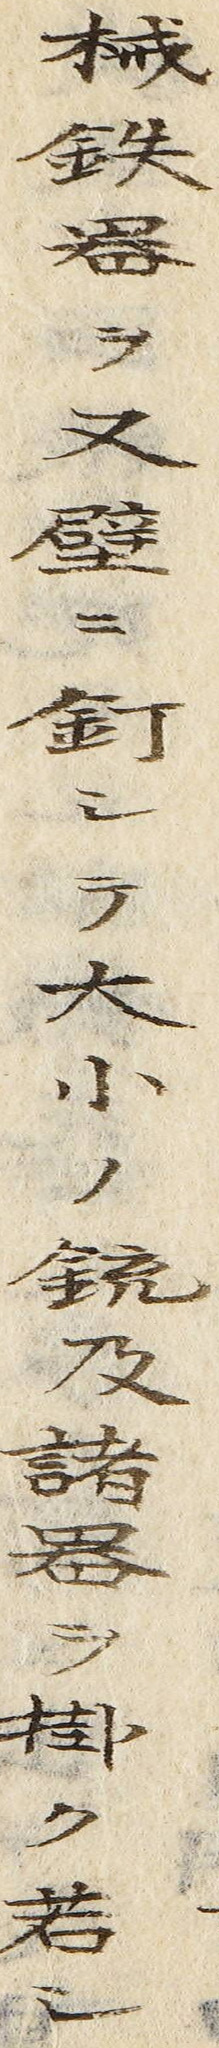械鉄器ヲ又壁ニ釘シテ大小ノ銃及諸器ヲ掛ク若シ
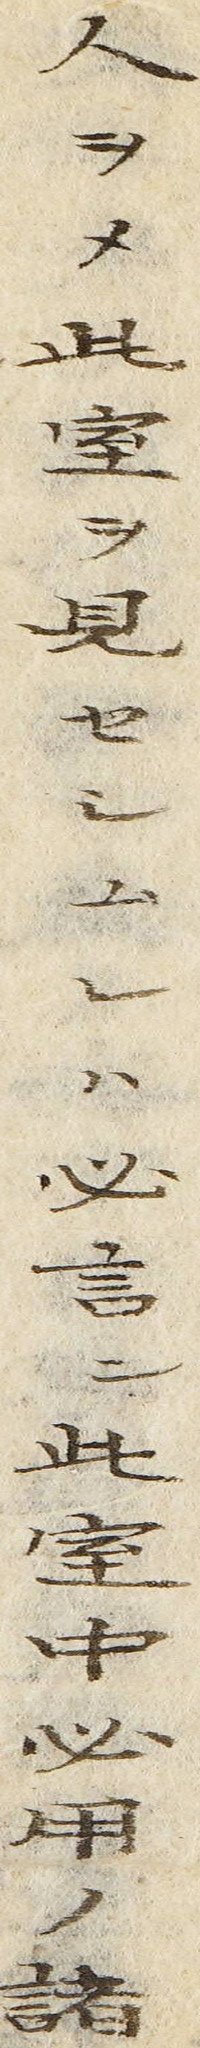人ヲシテ此室ヲ見セシムレハ必言ン此室中必用ノ諸
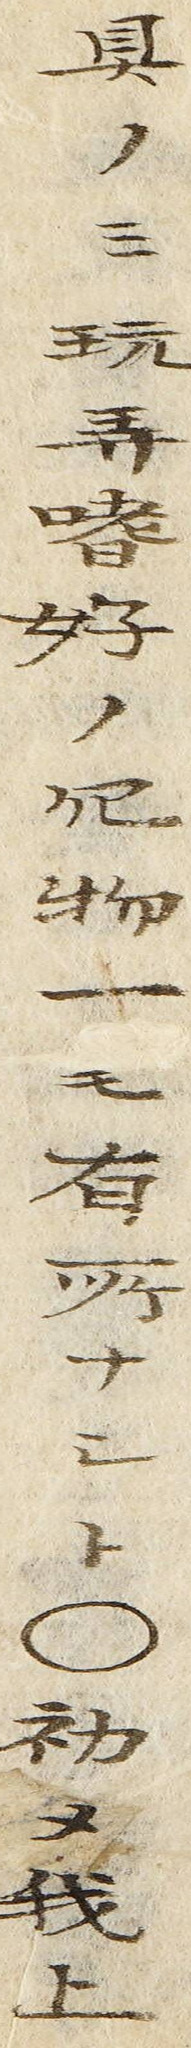具ノミ玩弄嗜好ノ冗物一モ有所ナシト◯初メ我上
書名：漂流紀事
